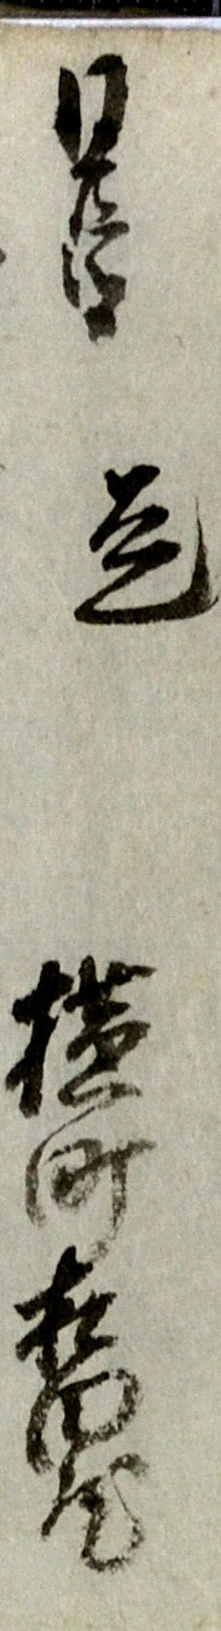同廿四日横町松田屋
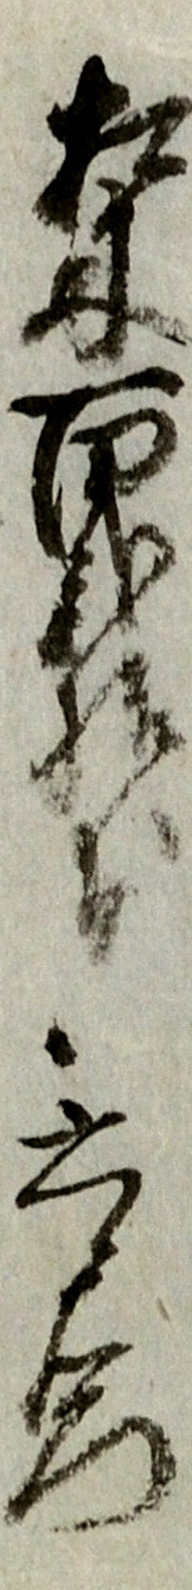松木百弐拾本六右衛門
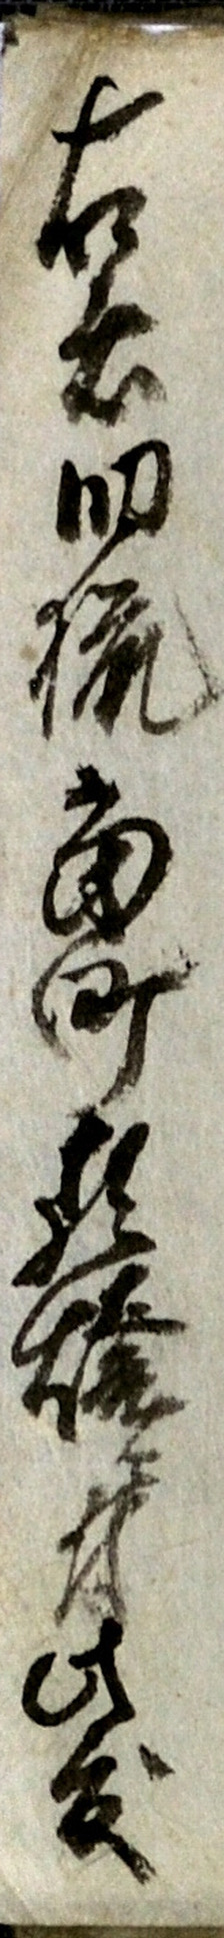右は旧臘当町類焼に付此度

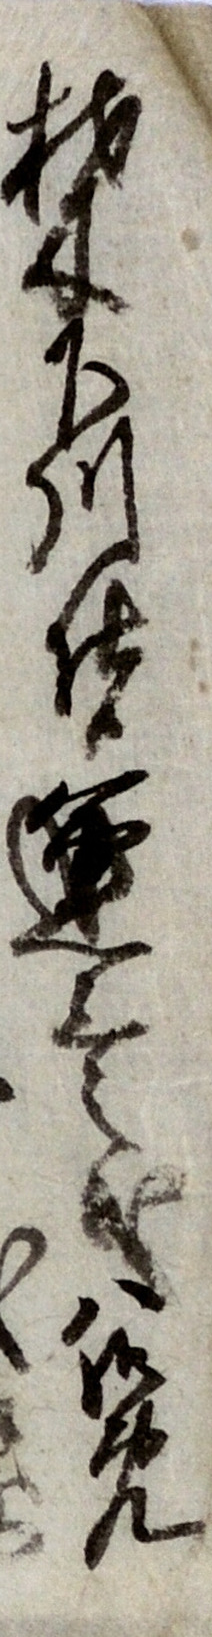材木下川仕候運上之義ハ御免
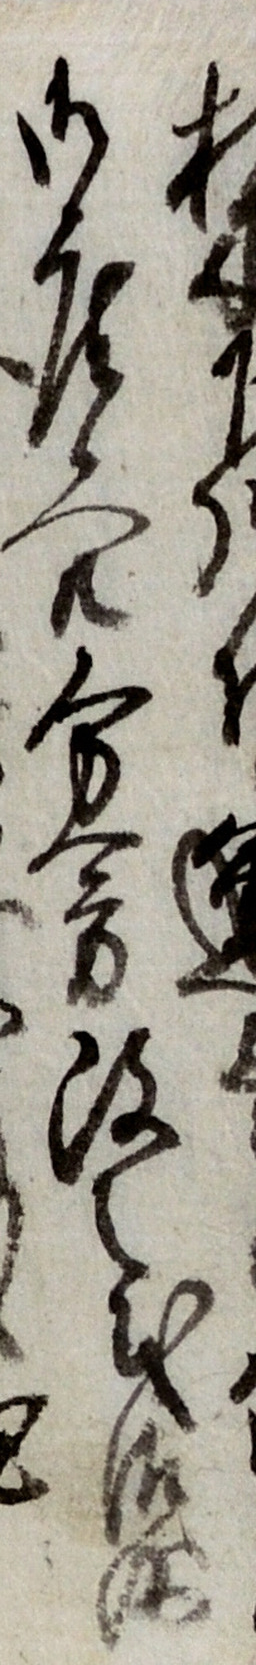御座候へ共分一方改之義御沙
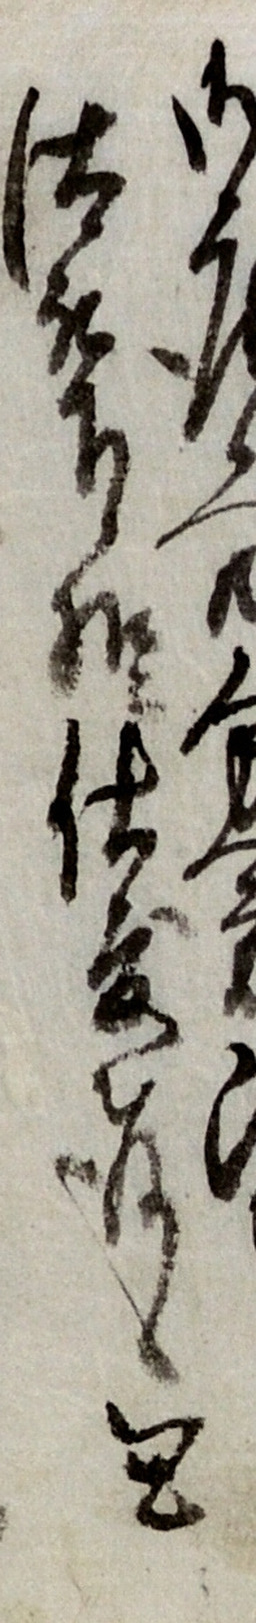汰被下候様ニ仕度奉存候以上
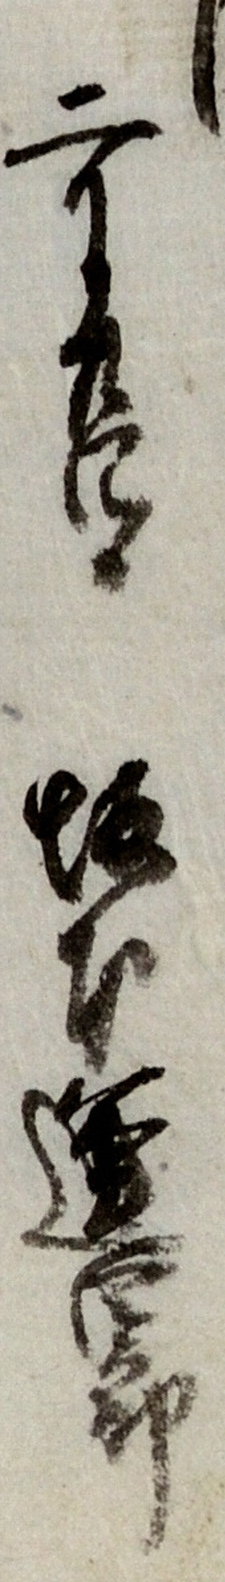二月廿四日坂本運四郎
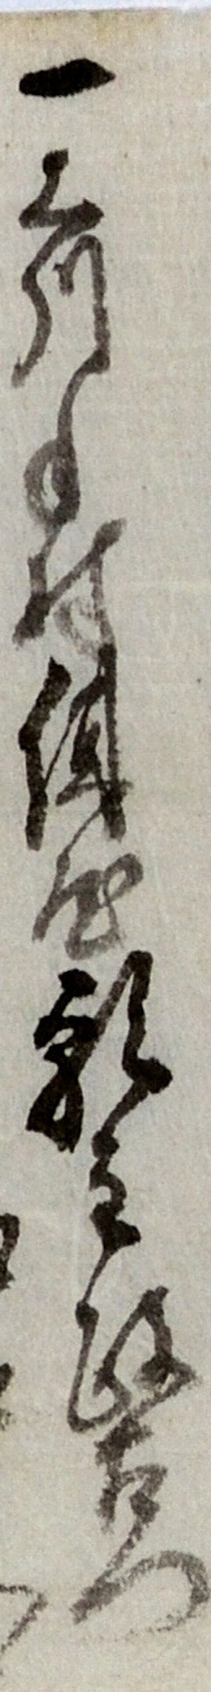一上川手村紺屋願主政右衛門
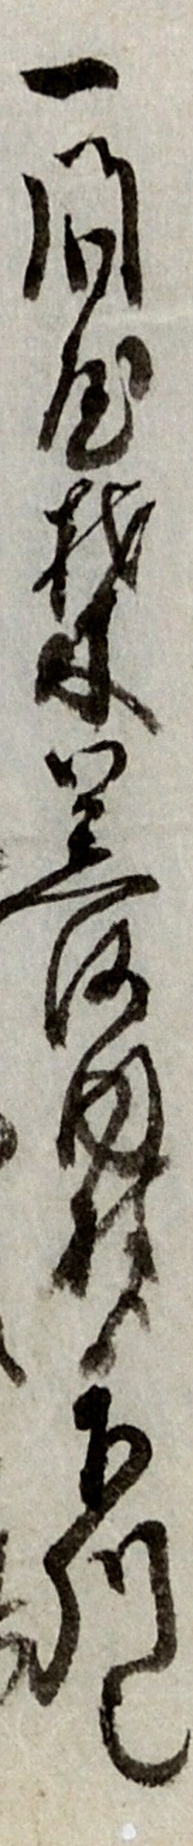一問屋材木黒河内村ゟ下川之
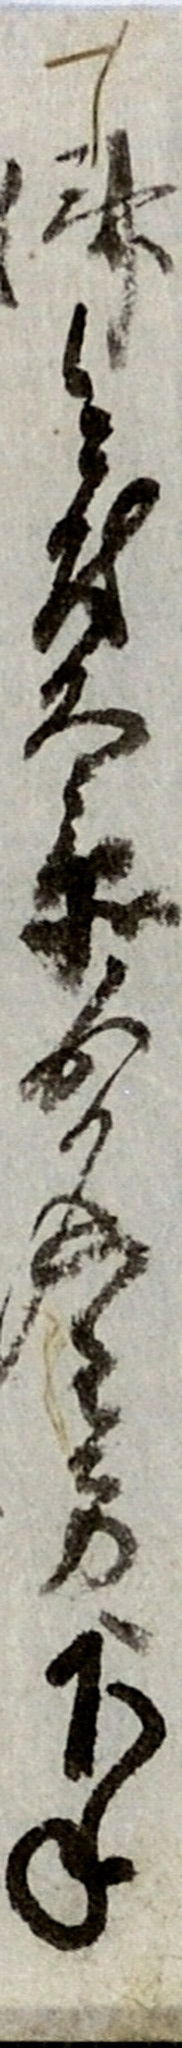済候ニ付久兵衛ゟ名主方へ下手
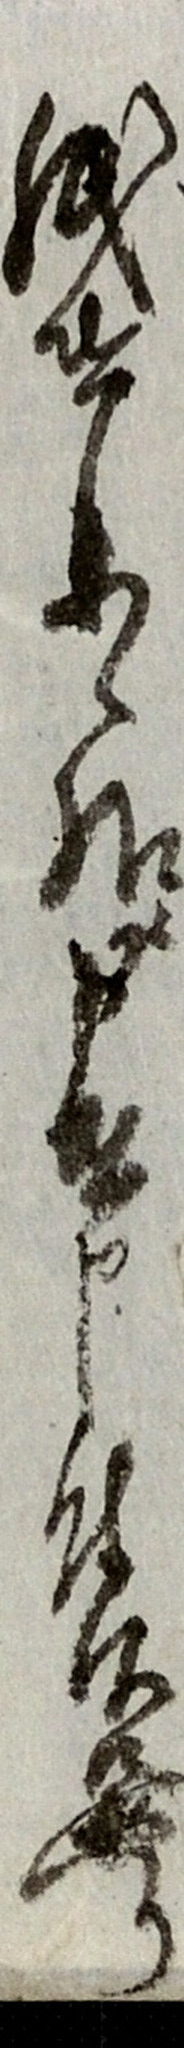紙遣参候様ニ申遣申付候図り
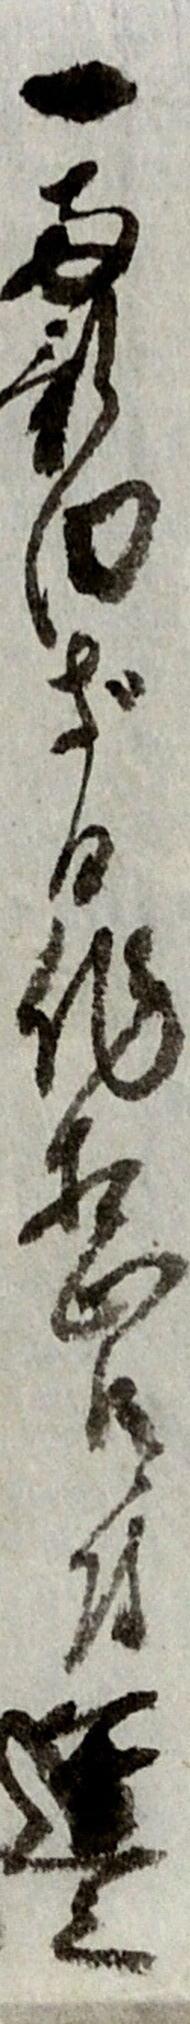一両新田ざる作相止候ニ付運上
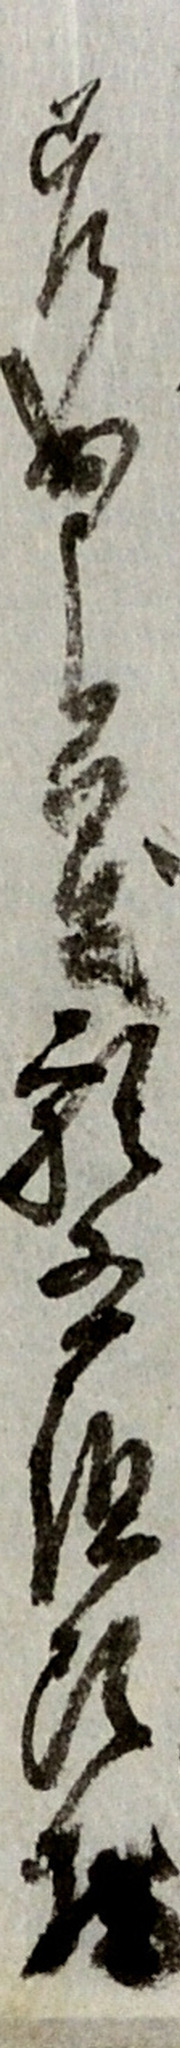差出申間敷願書組頭持
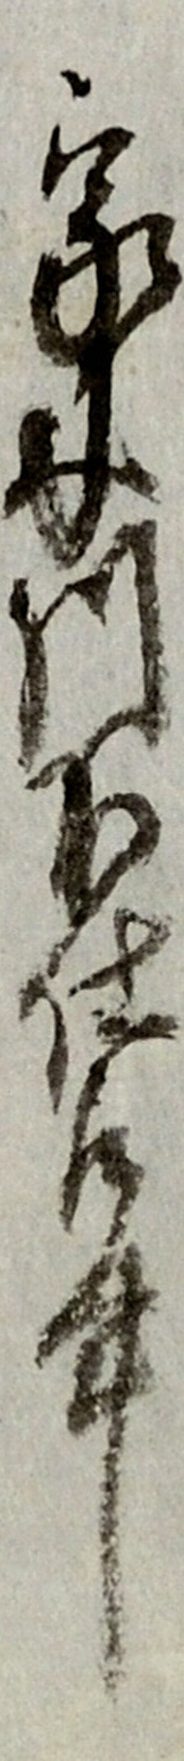家木川下仕候事
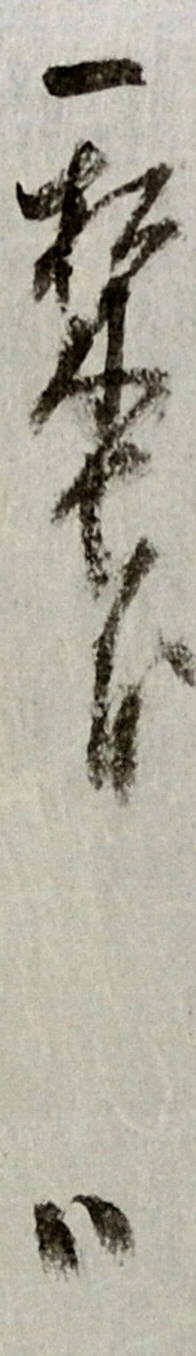一松木七本同
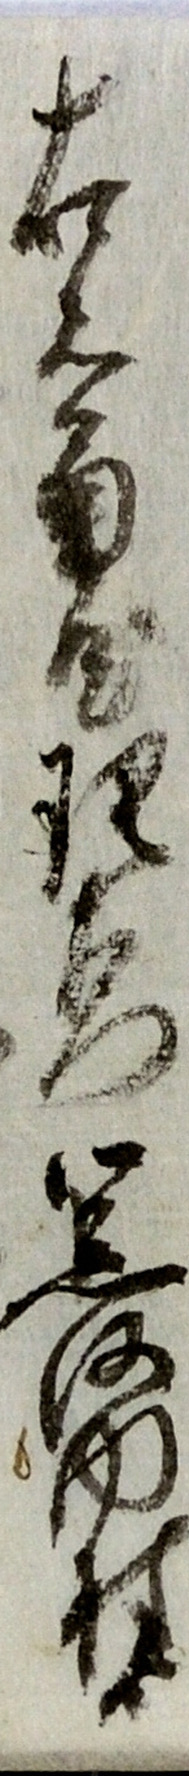右は角屋理右衛門黒河内村ゟ
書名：分一方諸事御用留帳
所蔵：伊那市立高遠町図書館・合同会社AMANE
